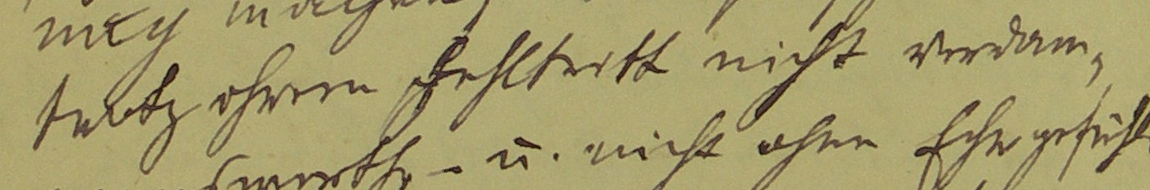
trotz ihrem Fehltritt nicht verdam¬
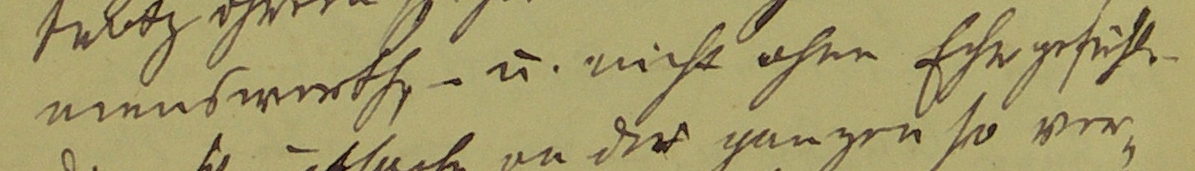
menswerth,- und nicht ohne Ehrgefühl.
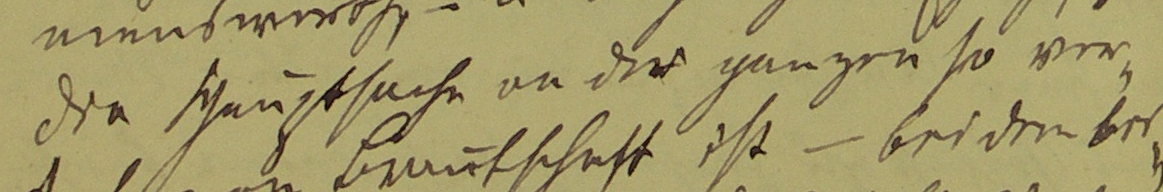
Die Hauptsache an der ganzen so ver¬
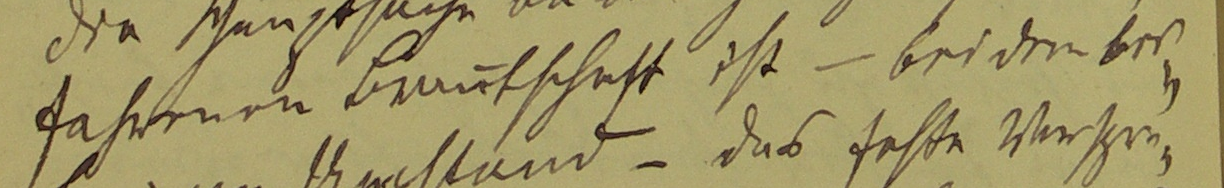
fahrenen Brautschaft ist- bei dem bis¬
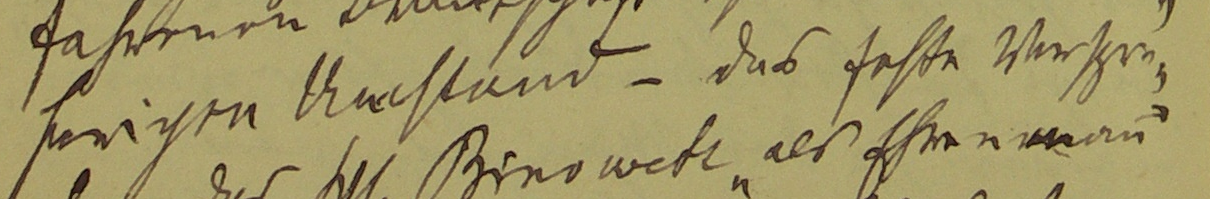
herigen Umstand- das feste Verspre¬
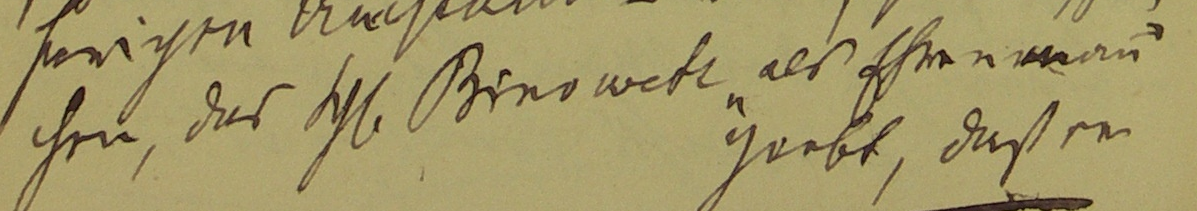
chen, das Ltn. Binowek als Ehrenmann
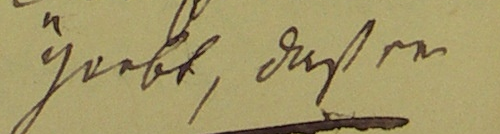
gibt, daß er
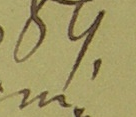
89
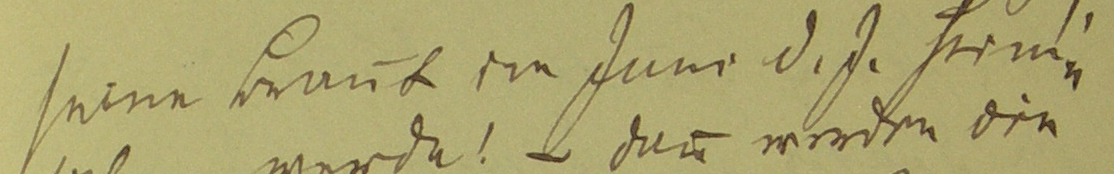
seine Braut im Juni dieses Jahres heim¬
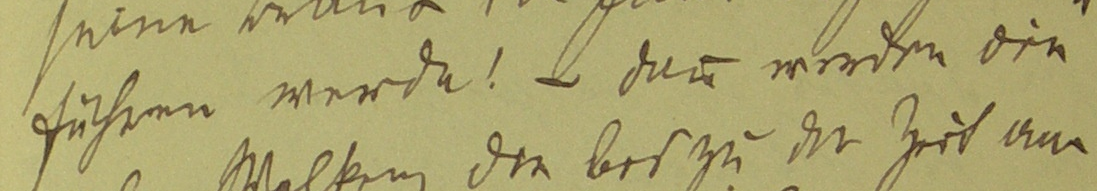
führen werde!- dann werden die
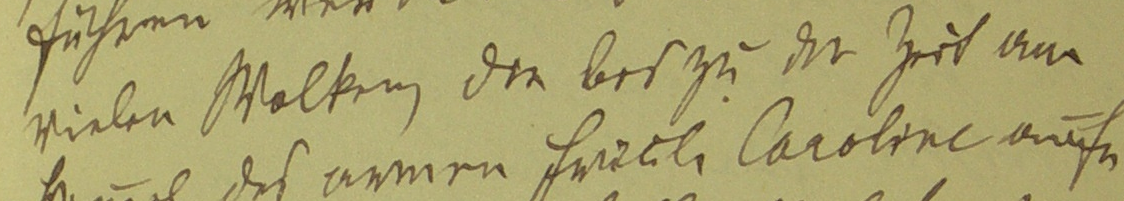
vielen Wolken die bis zu dieser Zeit am
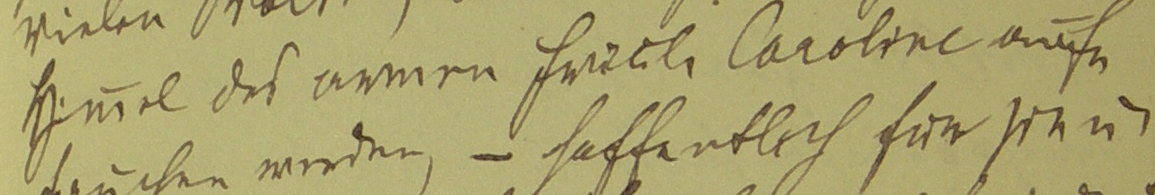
Himmel des armen Fräuleins Caroline auf¬
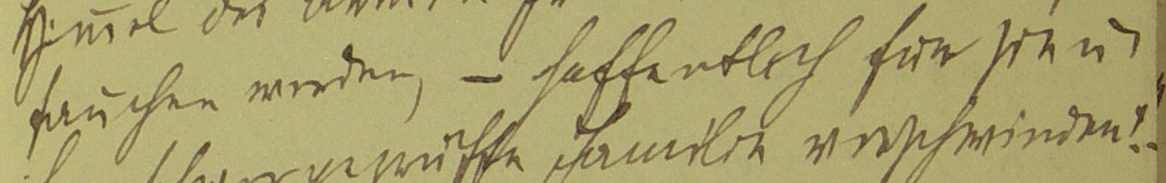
tauchen werden,- hoffentlich für sie und
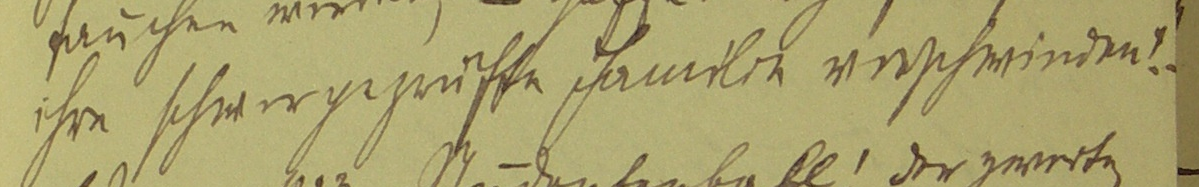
ihre schwergeprüften Familie verschwinden.
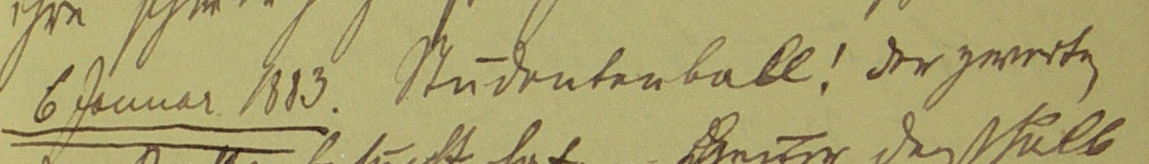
6. Januar 1883. Studentenball ! Der zweite
